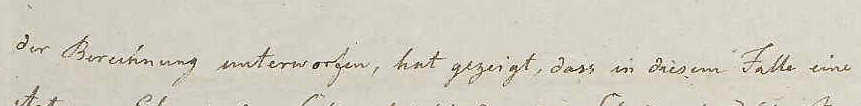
der Berechnung unterworfen, hat gezeigt, dass in diesem Falle eine
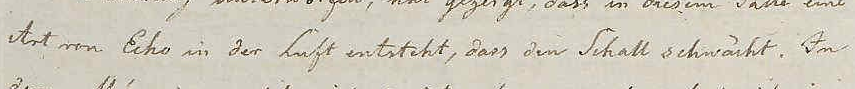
Art von Echo in der Luft entsteht, den Schall schwächt. In
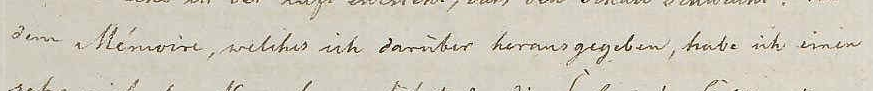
dem Mémoire, welches ich darüber herausgegeben, habe ich einen
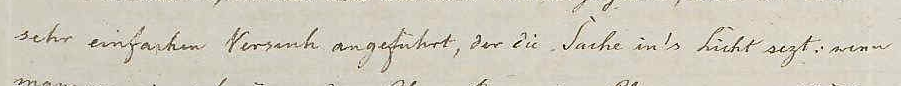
sehr einfachen Versuch angeführt, der die Sache in's Licht sezt: wenn
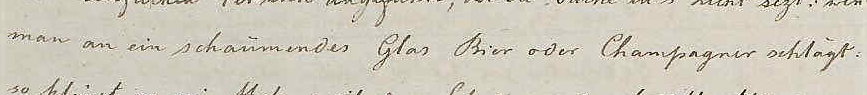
man an ein schäumendes Glas Bier oder Champagner schlägt:
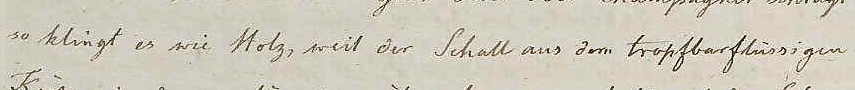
so klingt es wie Holz, weil der Schall aus derm tropfbarflüssigen
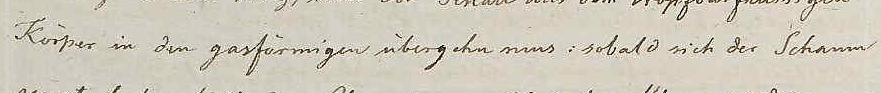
Körper in den gasförmigen übergehn mus: sobald sich der Schaum
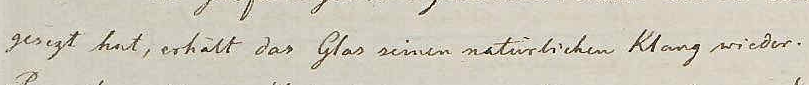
gesezt hat, erhält das Glas seinen natürlichen Klang wieder.
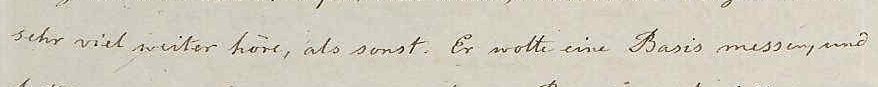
sehr viel weiter höre, als sonst. Er wolte eine Basis messen, und
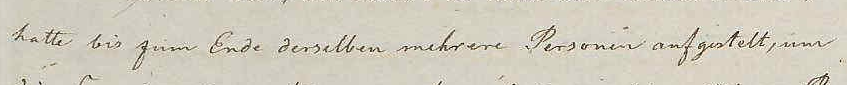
hatte bis zum Ende derselben mehrere Personen aufgestelt, um
